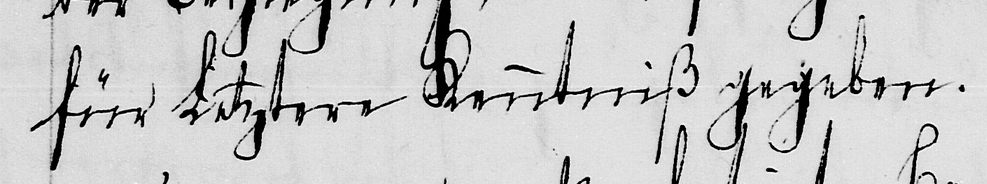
für Letztere Kenntniß gegeben.
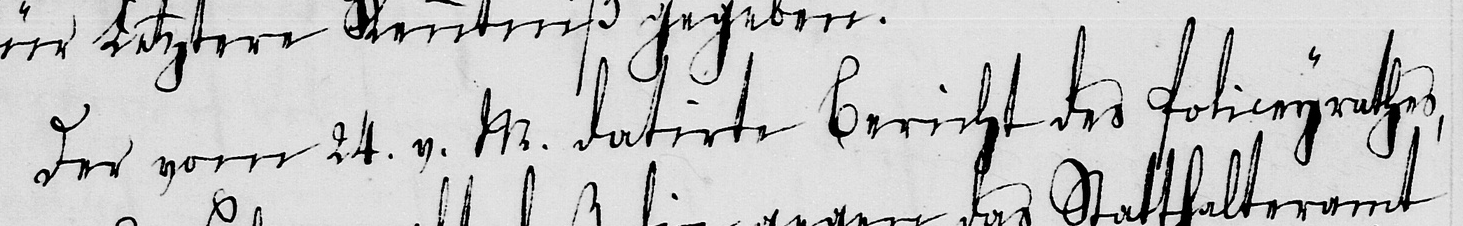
Der vom 24. v. M. datirte Bericht des Policeyrathes,
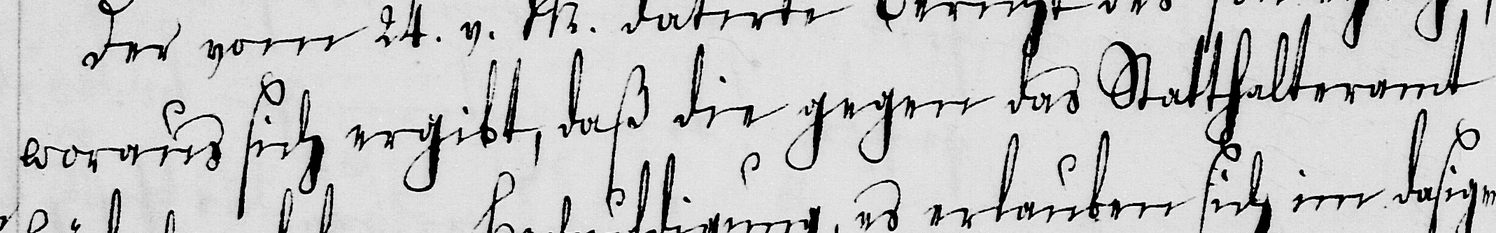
woraus sich ergibt, daß die gegen das Statthalteramt
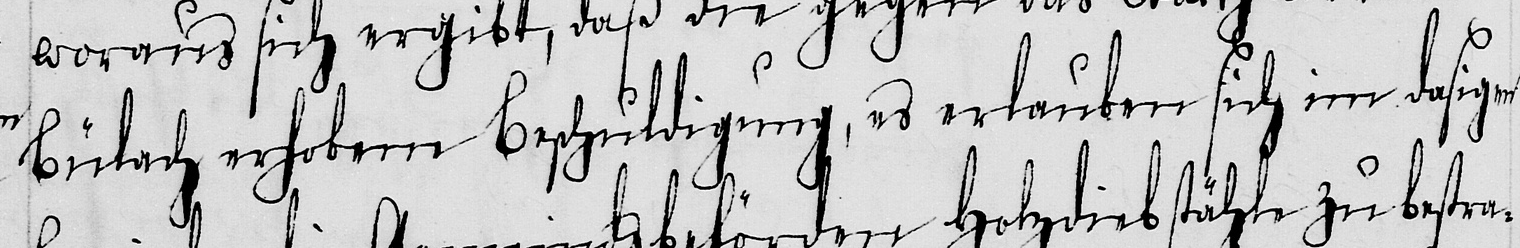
Bülach erhobene Beschuldigung, es erlauben sich im dasi¬
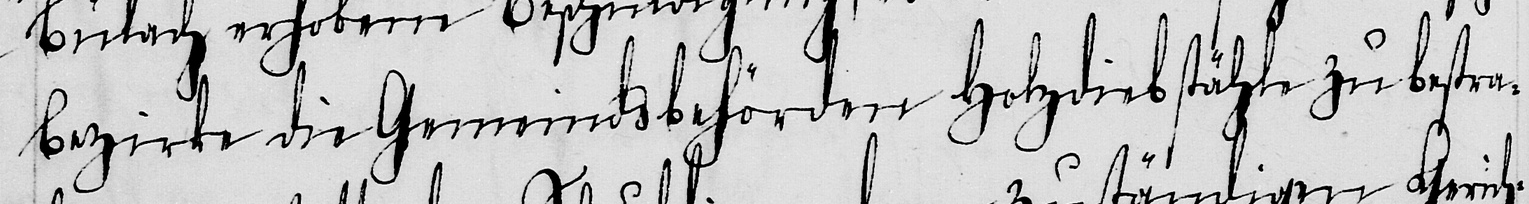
Bezirke die Gemeindsbehörden Holzdiebstähle zu bestr¬
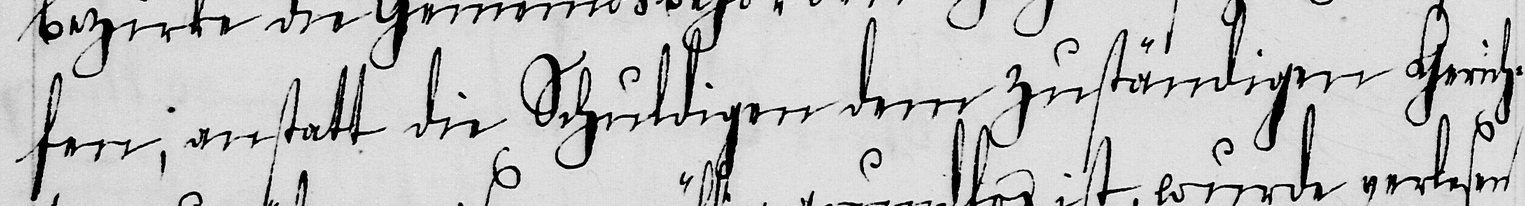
afen; anstatt die Schuldigen dem zuständigen Geri¬
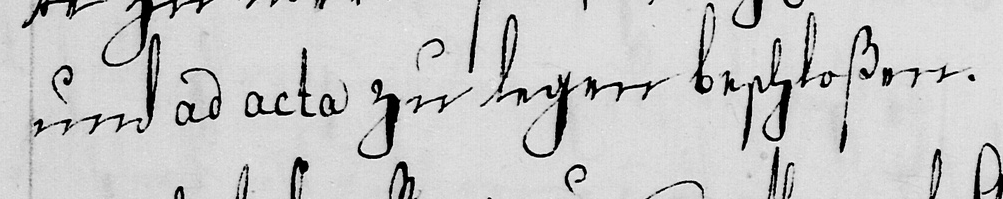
und ad acta zu legen beschloßen.
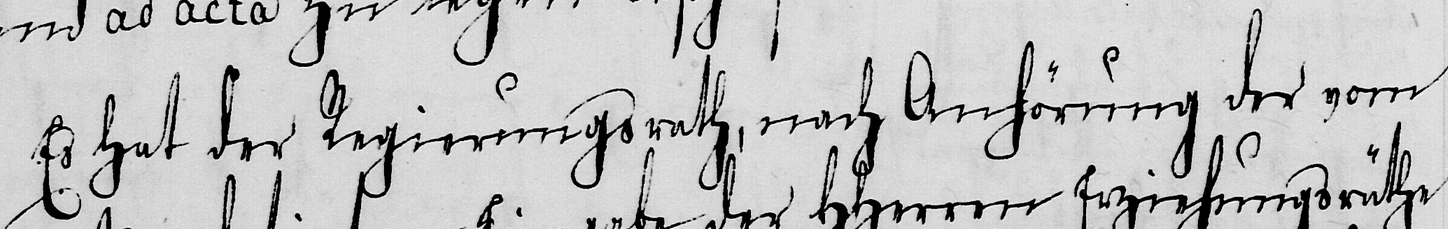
Es hat der Regierungsrath, nach Anhörung der vom
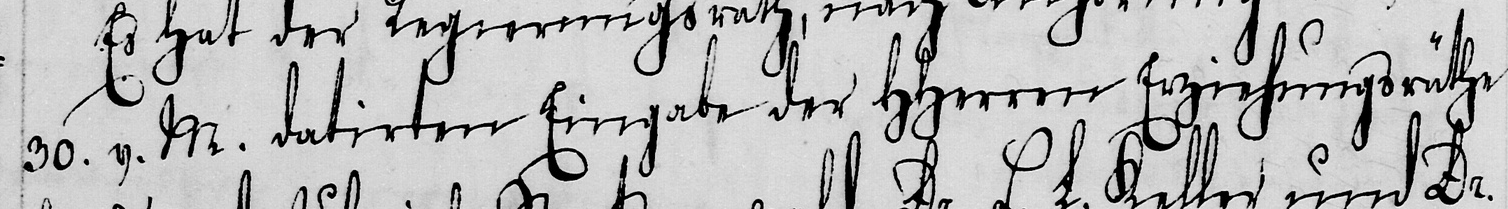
30. v. M. datirten Eingabe der HHerren Erziehungsräthe
